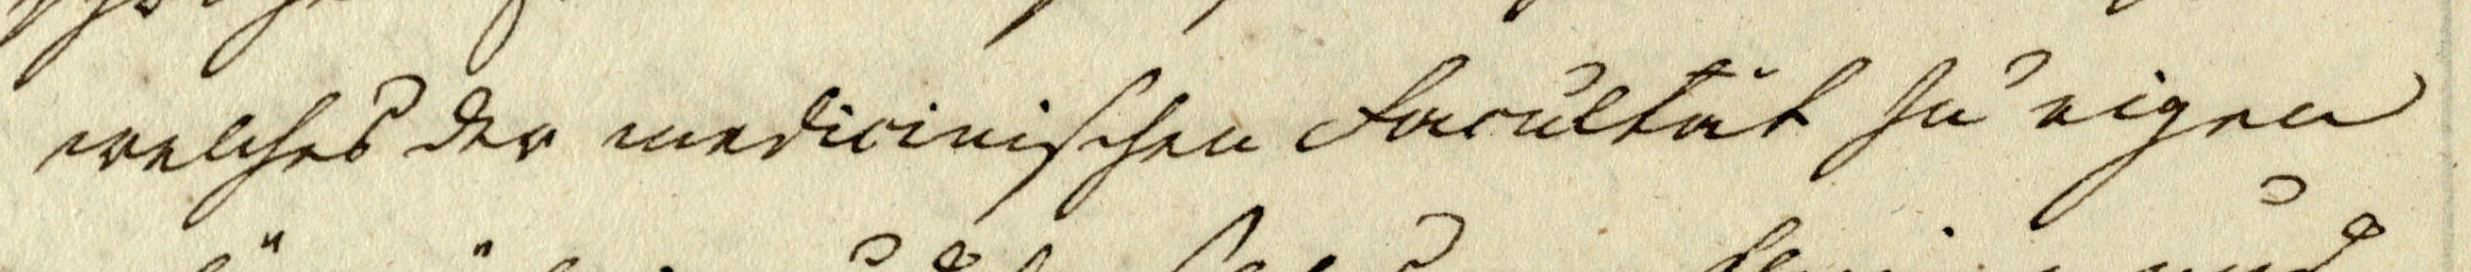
welches der medicinischen Facultät zu eigen
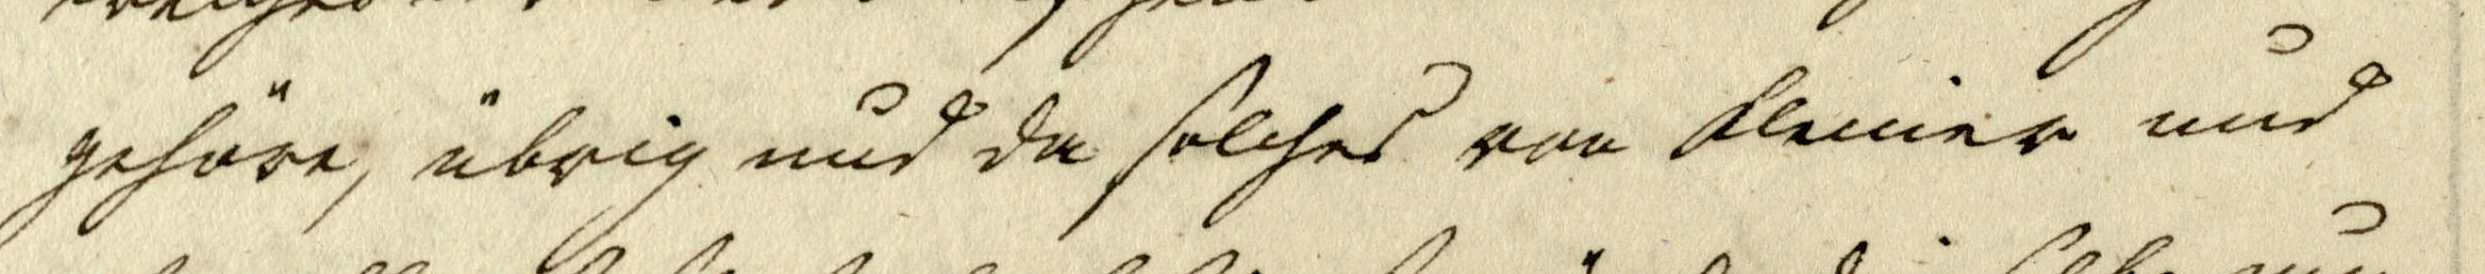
gehöre, übrig und da solches von kleiner und
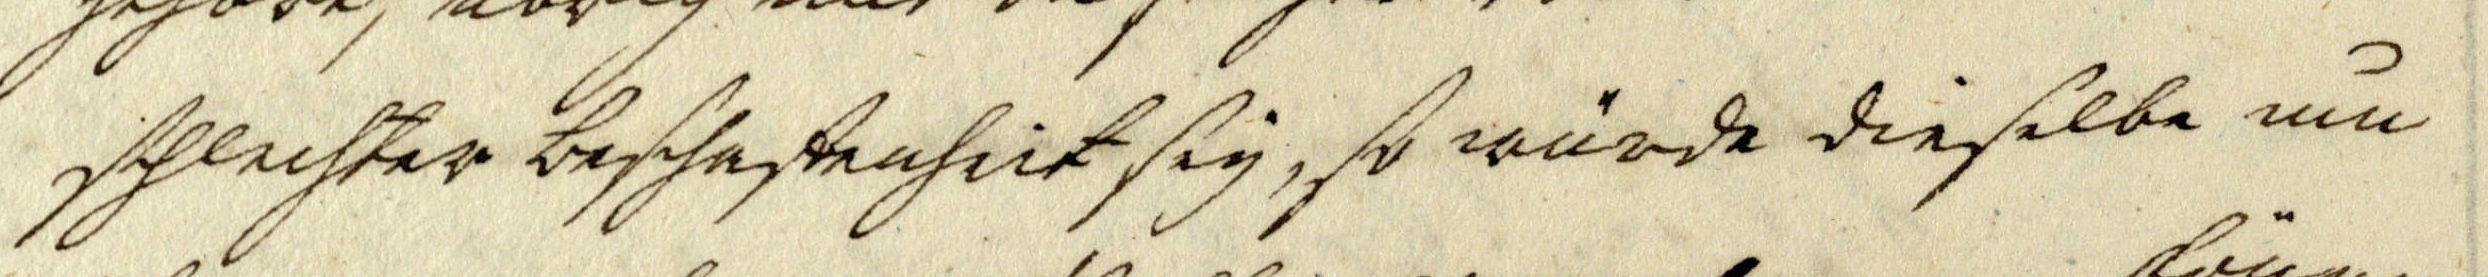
schlechter Beschaffenheit seÿ, so würde dieselbe um
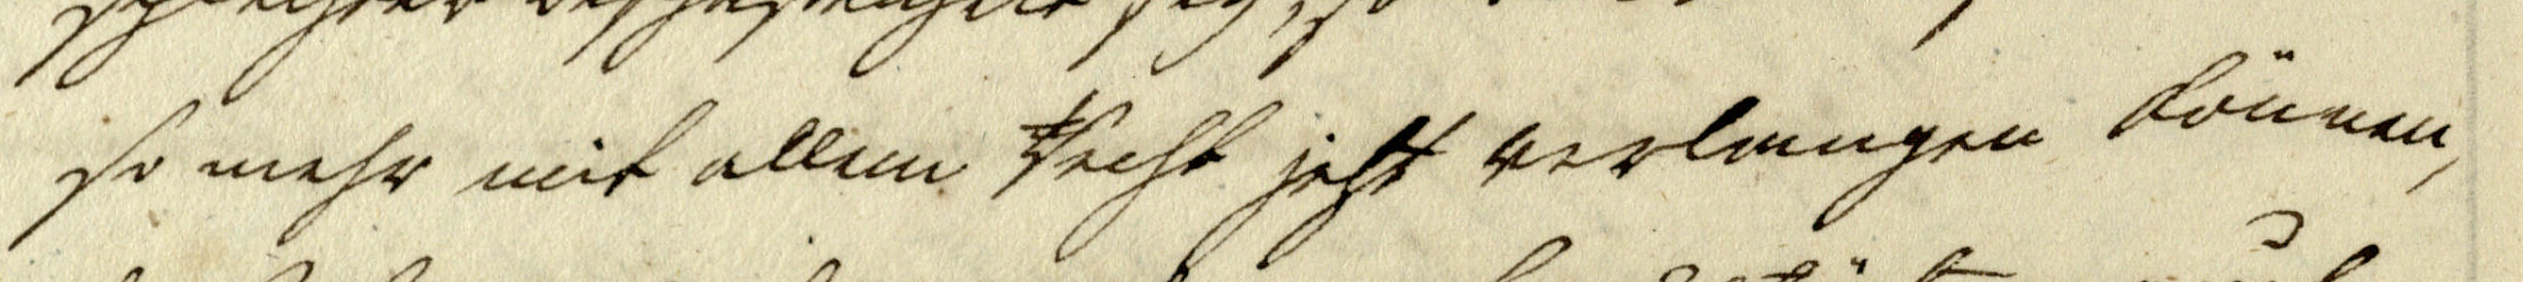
so mehr mit allem Recht jetzt verlangen können,
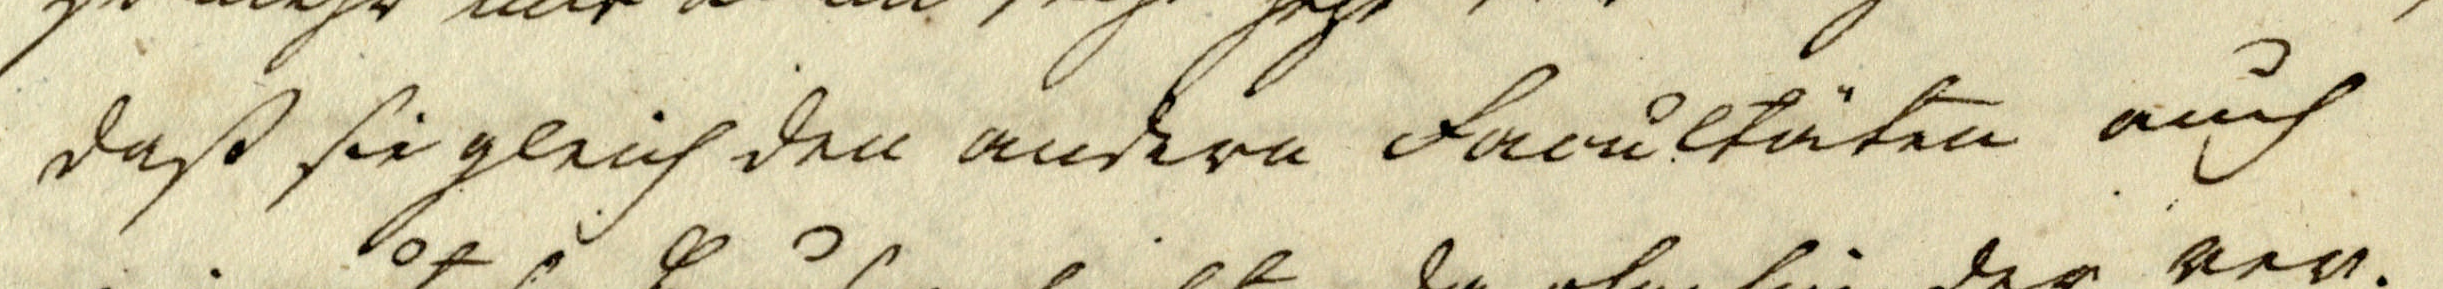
daß sie gleich den andern Facultäten auch
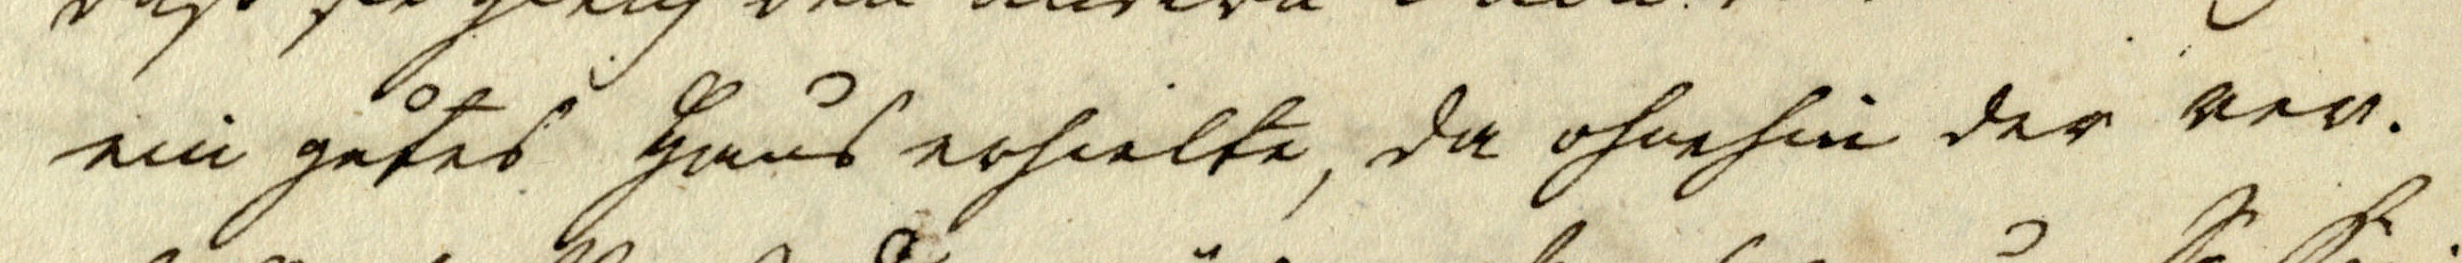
ein gutes Haus erhielte, da ohnehin der ver¬
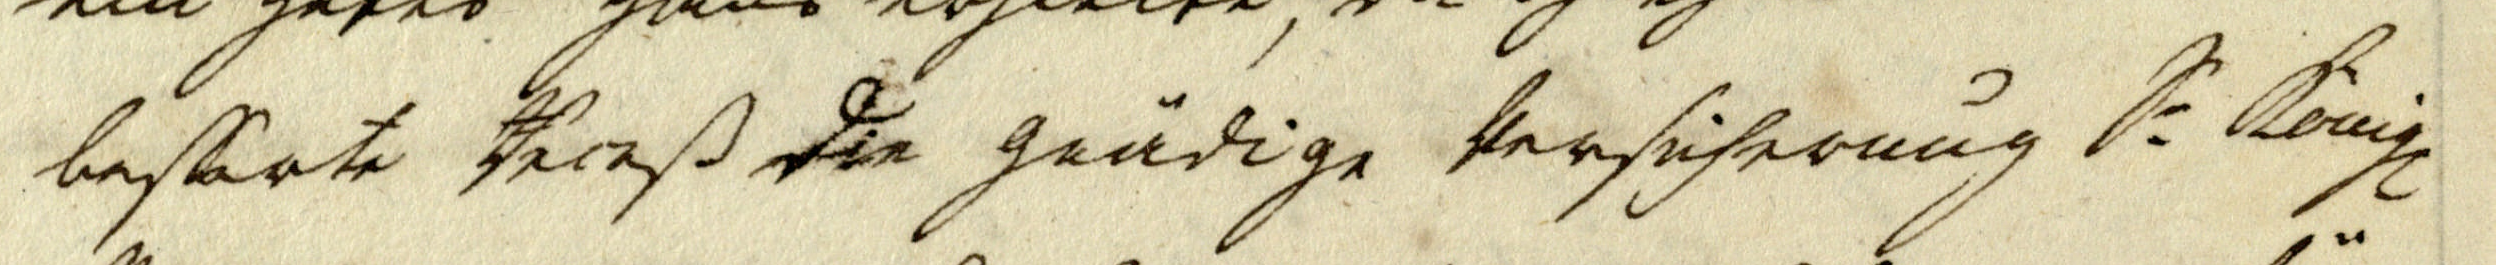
besserte Receß die gnädige Versicherung Sr Königl.
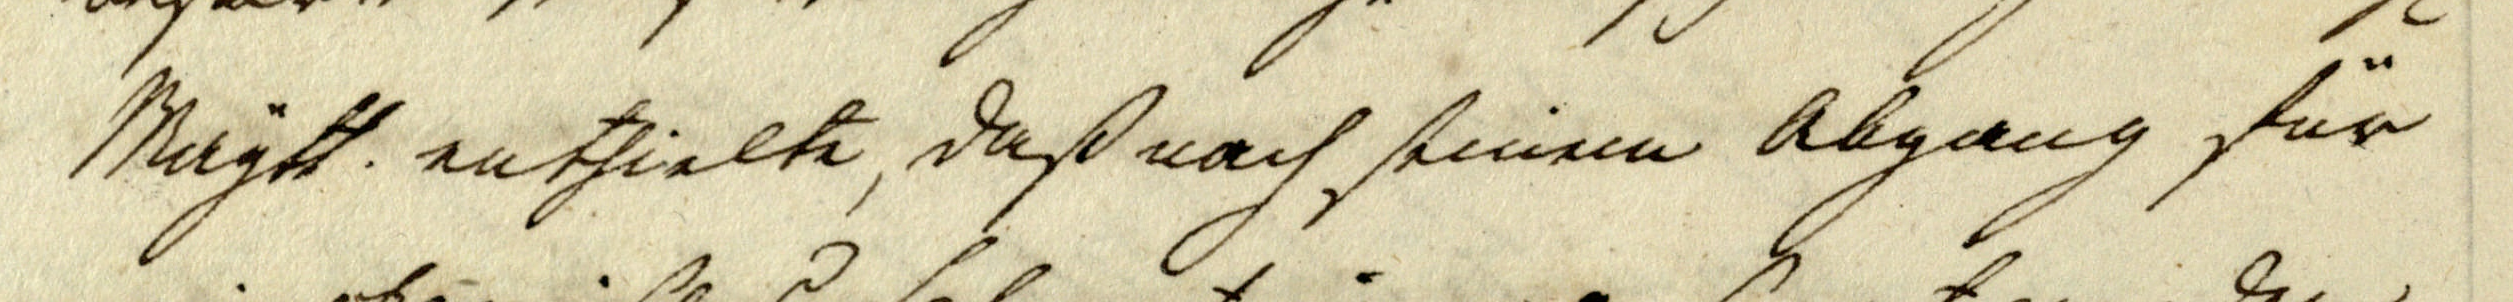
Maÿtt. enthielte, daß nach seinem Abgang für
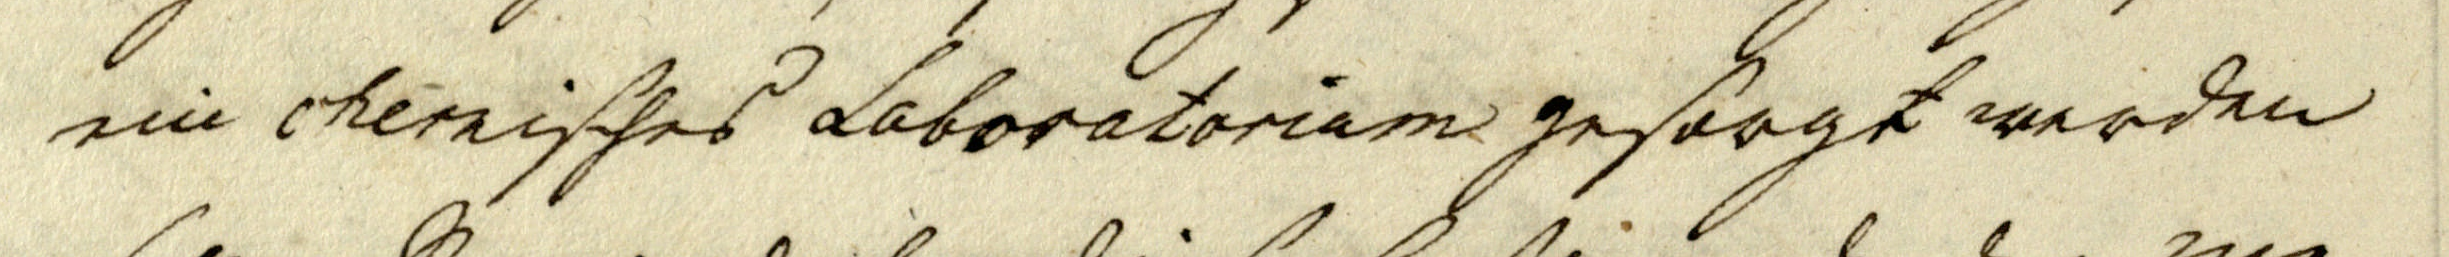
ein chemisches Laboratorium gesorgt werden
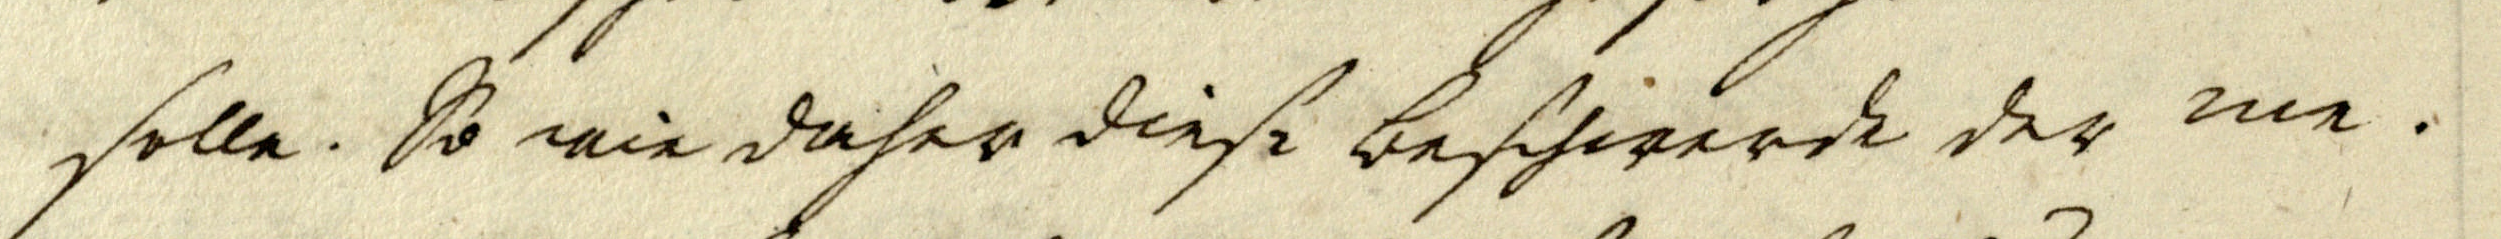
solle. So wie daher diese Beschwerde der me¬
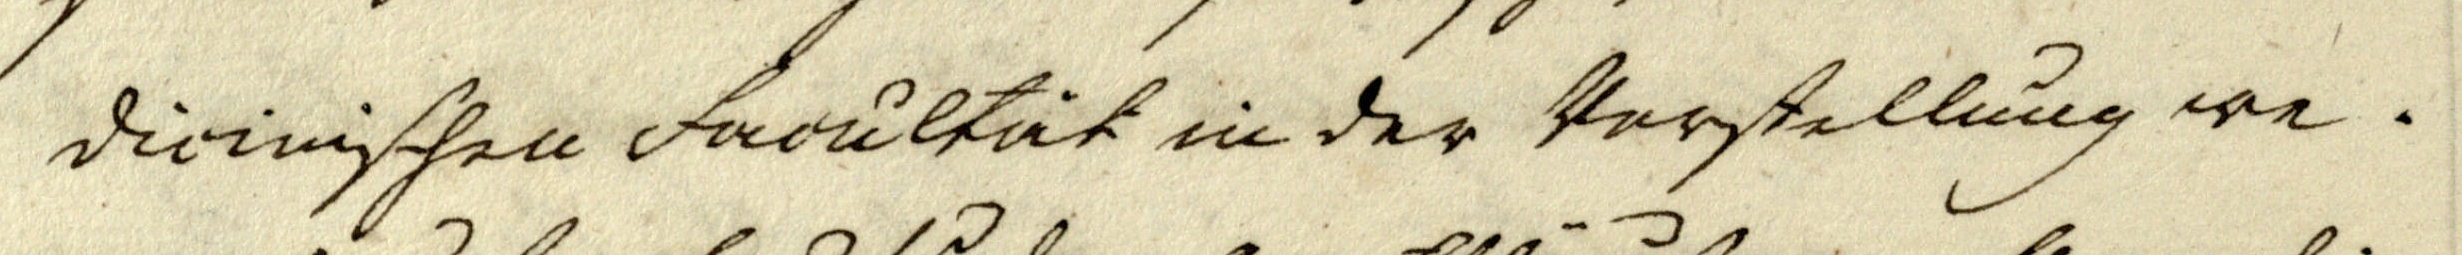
dicinischen Facultät in der Vorstellung we¬
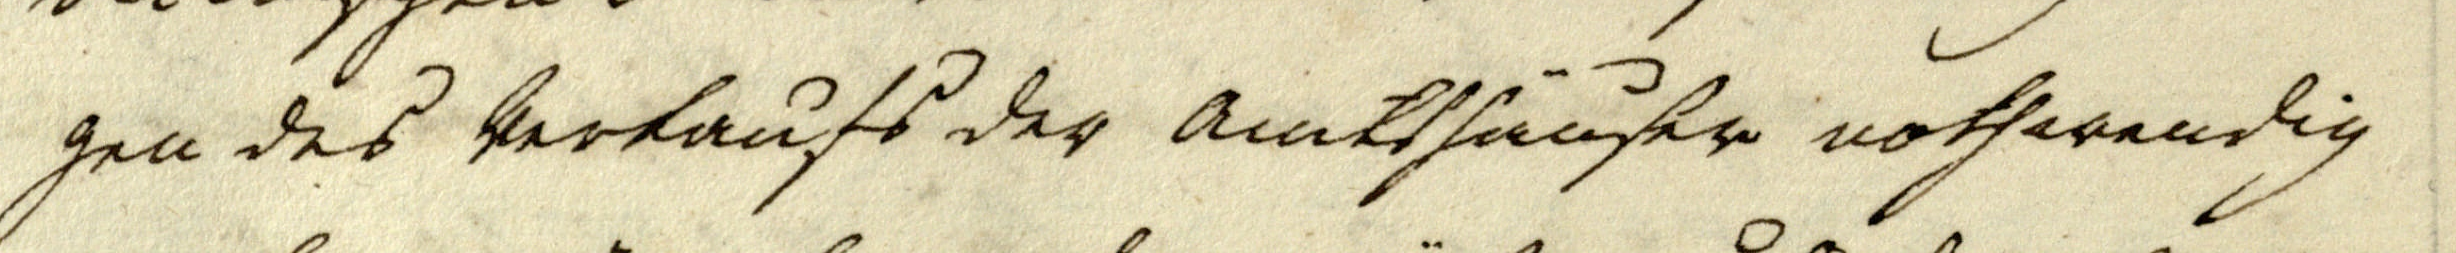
gen des Verkaufs der Amtshäuser nothwendig
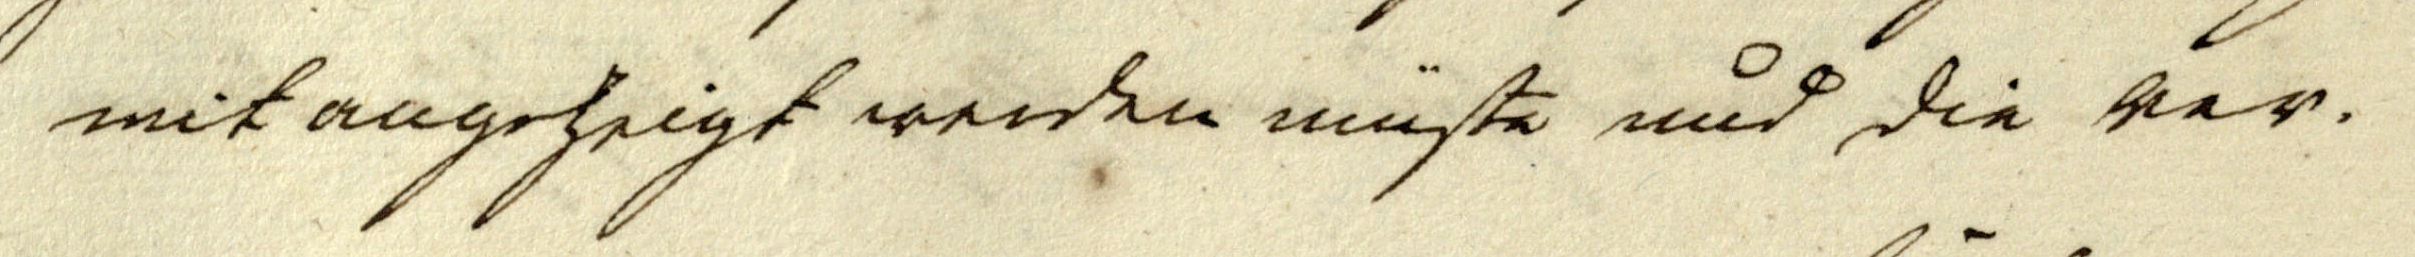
mit angezeigt werden müßte und die ver¬
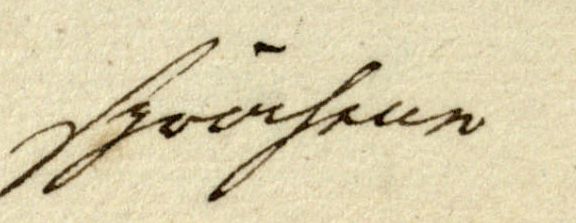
sprochene
